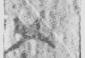五
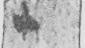十
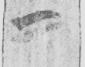二
